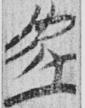○（吾）
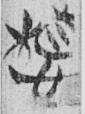○（直）
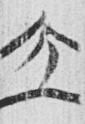立
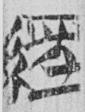經（徑）
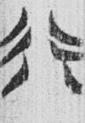行
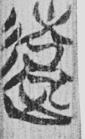遠
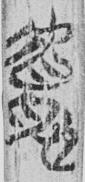○（慮）
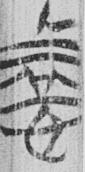○（圖）
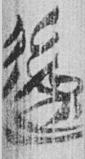○（後）
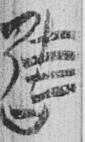唯（雖）
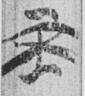不
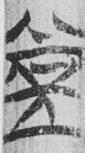○（當）
